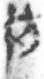紡
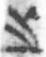之
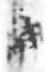綳
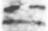二
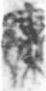○（秦）
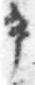弓
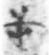矢
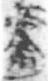○（箙）
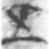五
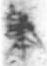秉
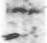一
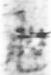○（戟）
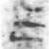二
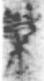菓（戈）
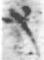又（有）
